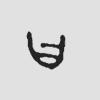曰
